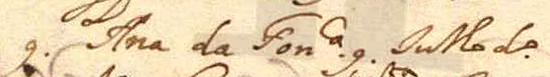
9. Ana da Fonca. 9. Iulho d.o
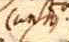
Cunh̄a
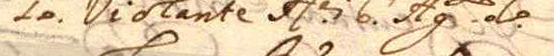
10. Violante H.es 6. Ag.to d.o
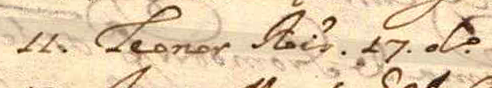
11. Leonor Rois̄. 17. d.o
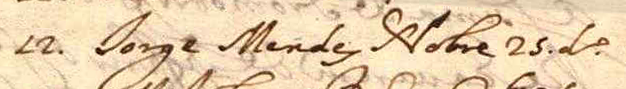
12. Iorge Mendes Nobre 25. d.o
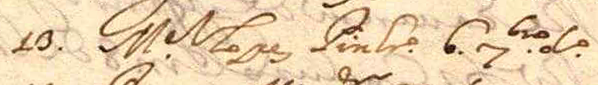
13. M.el Lopes Pinhr.o 6. 7.bro d.o
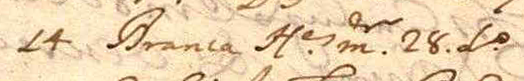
14 Branca H.es mer. 28. d.o
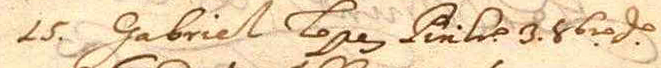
15. Gabriel Lopes Pinh.o 3. 8.bro d.o
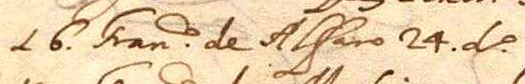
16. Fran.co de Alfaro 24. d.o
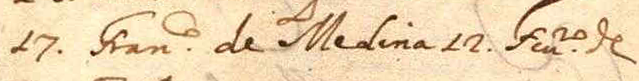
17. Fran.co de Medina 12. Feu.ro de
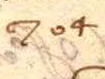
704
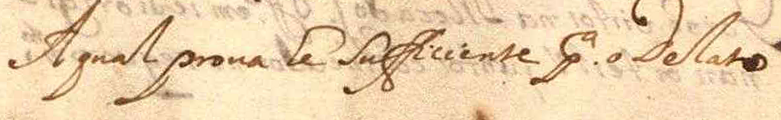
A qual proua he sufficiente p.a o Delato
